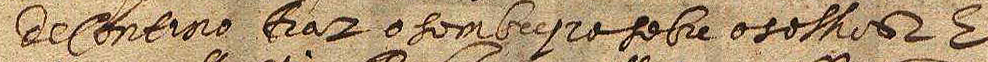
de Contino traz o sombrejro sobre os olhos E
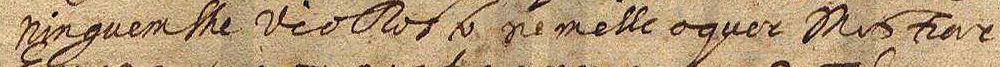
ninguem lhe vio Rosto nem elle o quer mostrar
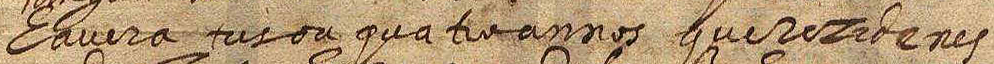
E auera tres ou quatro annos que rezide nes
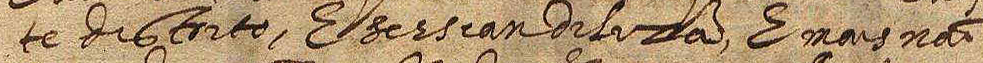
te distrito, E se Escandelizaõ, E mais naõ
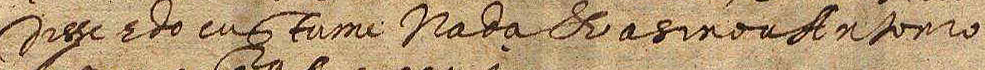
disse E do custume nada & asinou Antonio
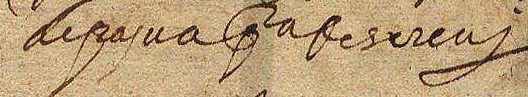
de pajua pra O escreuj
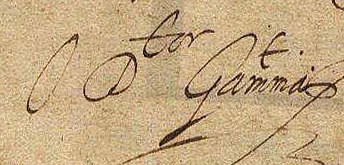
O Dtor Gamma
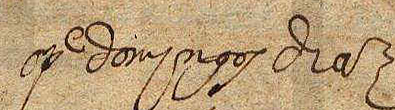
o pe domjngos diaz
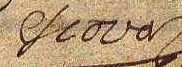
escovar
